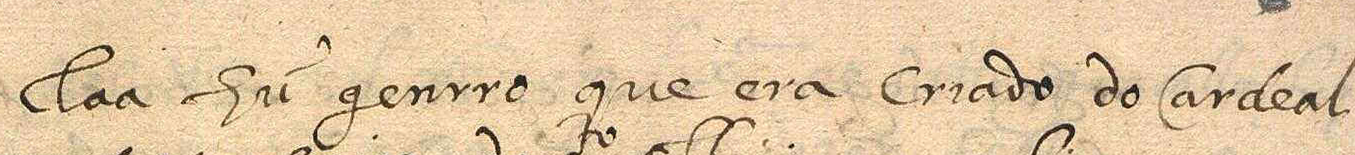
laa hū genrro que era criado do Cardeal
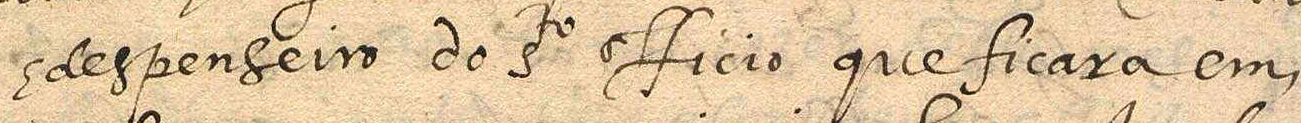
E despenseiro do sto officio que ficara em
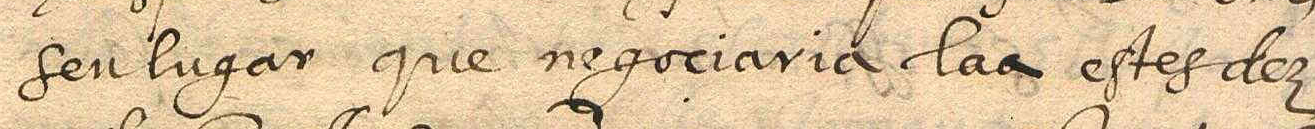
seu lugar que negociaria laa estes dez
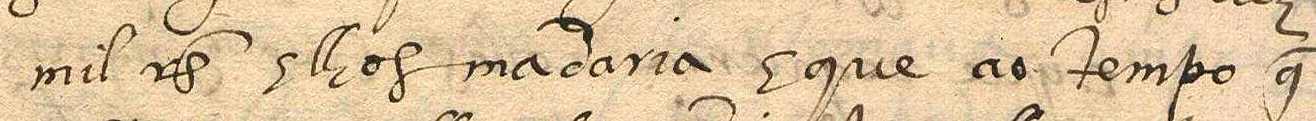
mil rs̄ E lhos mādaria E que ao tempo q̄
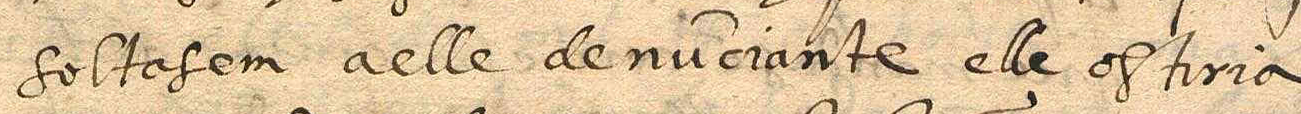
soltasem a elle denūciante elle os tiria
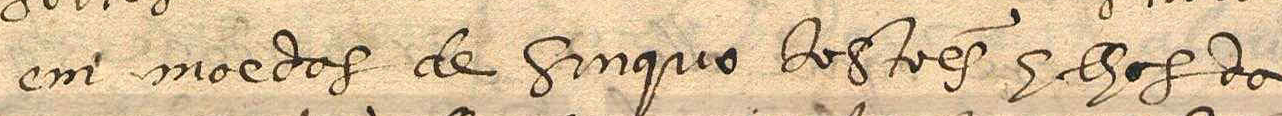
em moedas de sinquo tostoẽs E lhos da
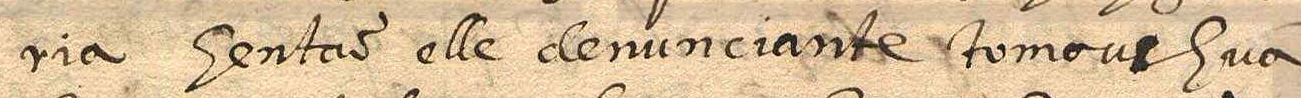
ria E entaõ elle denunciante tomou huā
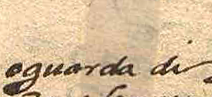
o guarda diz
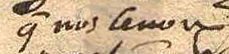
q̄ uos leuou
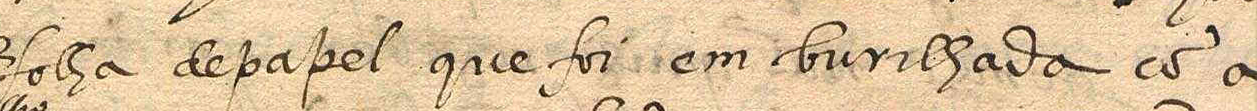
folha de papel que foi emburilhada cō a
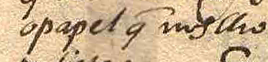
o papel q̄ uos lho
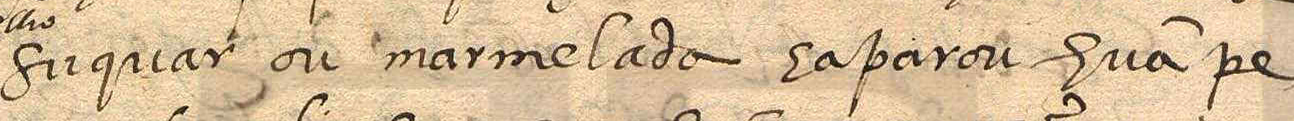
suquar ou marmelada E aparou huā pe
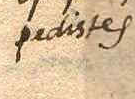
pedistes
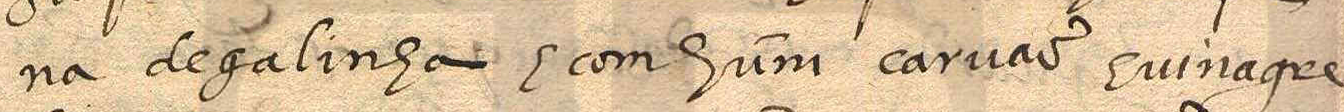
na de galinha E com hum caruaõ E uinagre
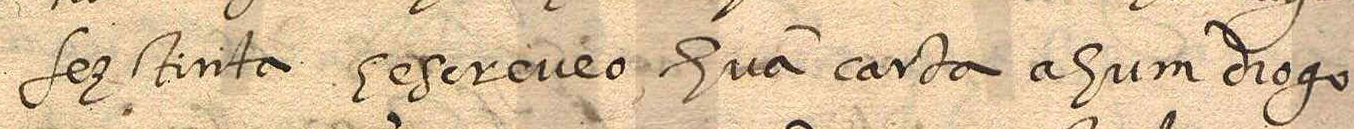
fez tinta E escreueo hua carta a hum diogo
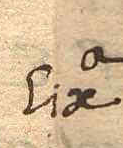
lixa
